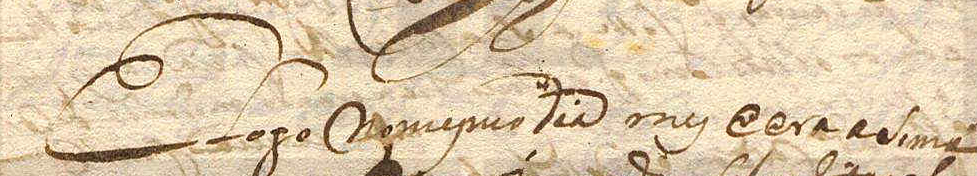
E Logo no mesmo dia mes e era asima
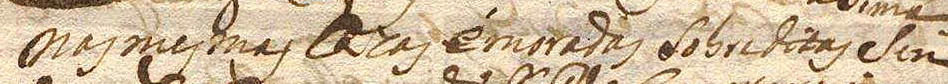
nas mesmas Cazas e moradas sobreditas sen
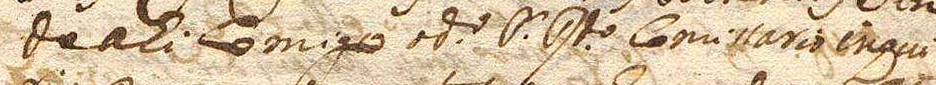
do ahi Comigo o d.o s.r R.do Comissario inqui
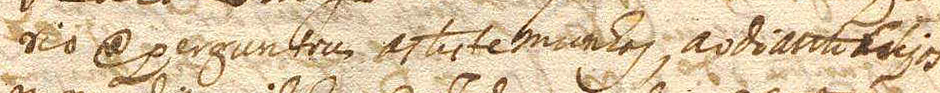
rio e perguntou as testemunhas, ao diante Cujos
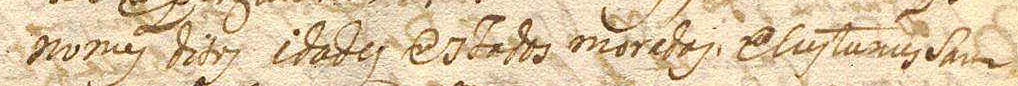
nomes ditos idades estados moradas, e custumes sam
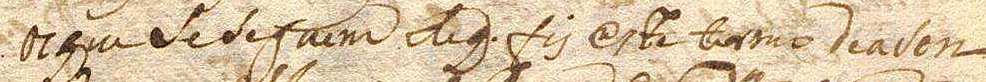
os que se seguem de q̄. fis este termo de asen
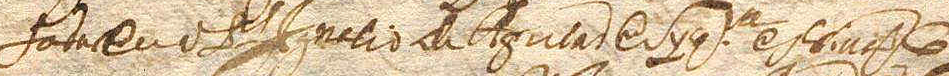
tada eu o P.e Jgnacio de Aguiar e Syq.ra escriuaꝭ Co
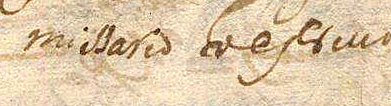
missario o escreui
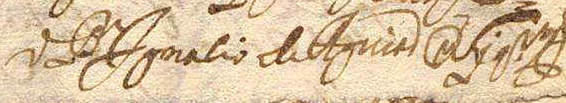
o Pe Jgnacio de Aguiar e Syq.ra
